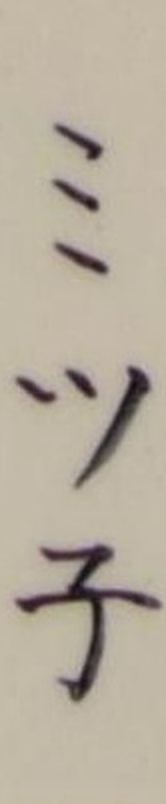ミツ子
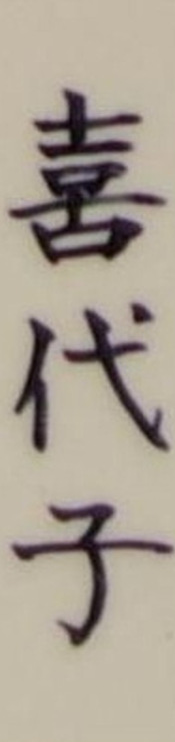喜代子
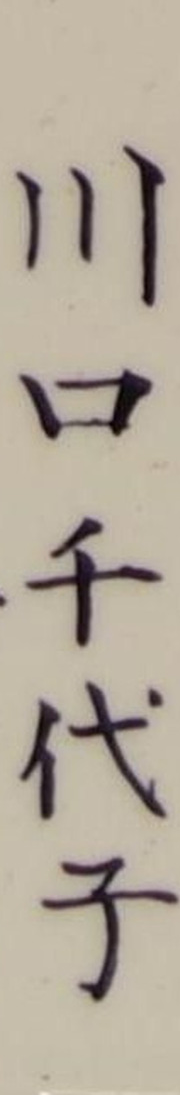川口千代子
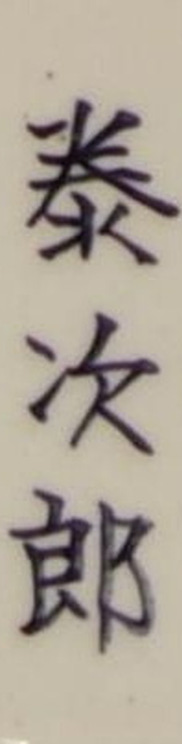泰次郎
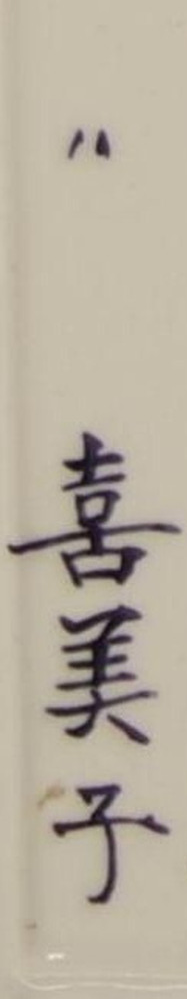喜美子
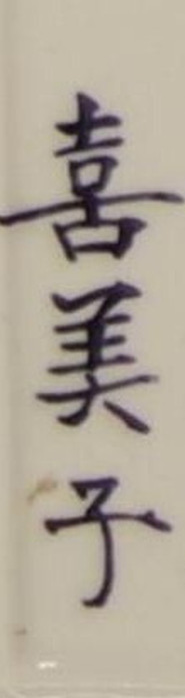喜美子

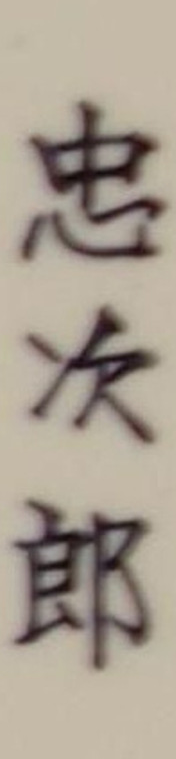忠次郎
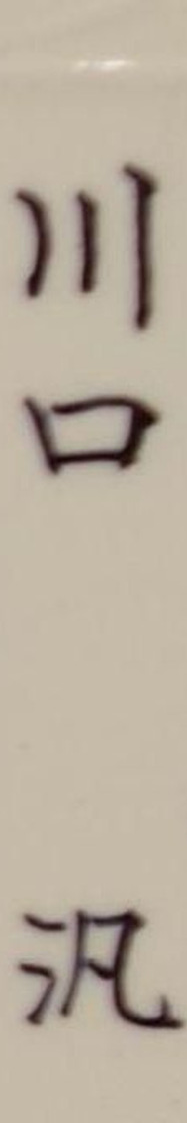川口汎
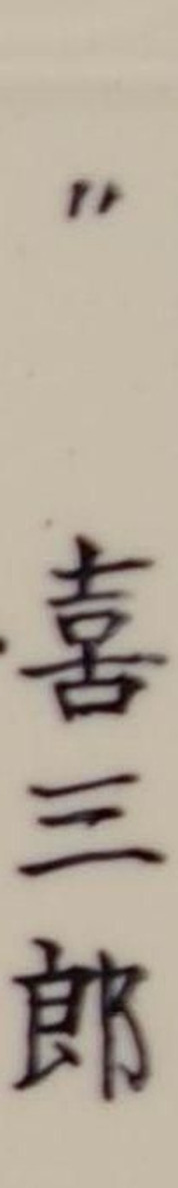喜三郎
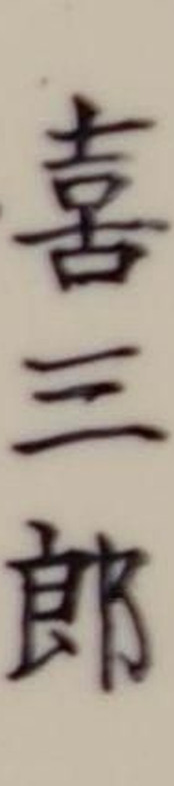喜三郎
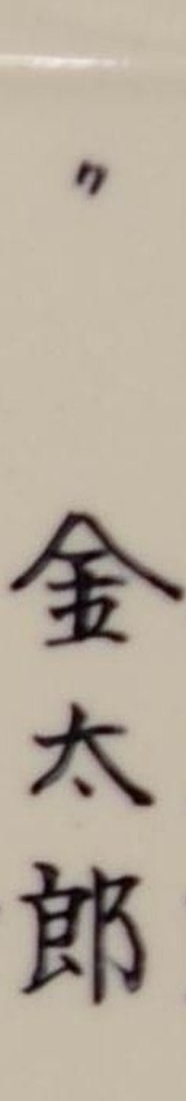金太郎
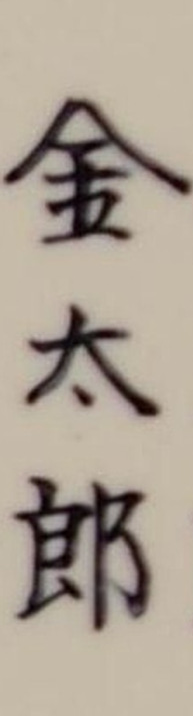金太郎
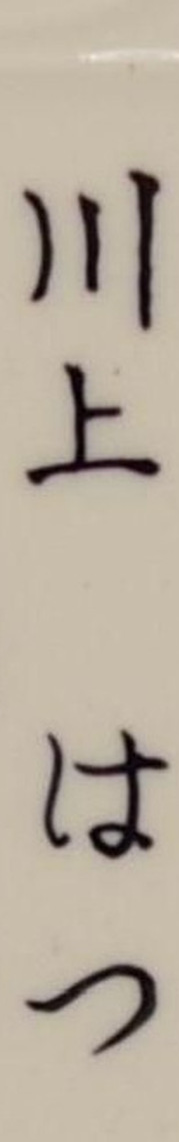川上はつ
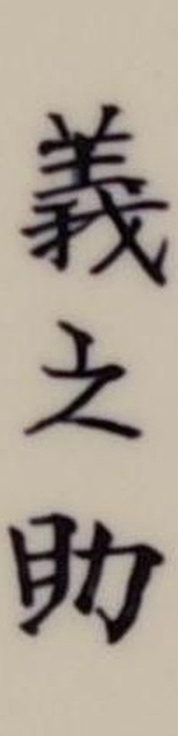義之助
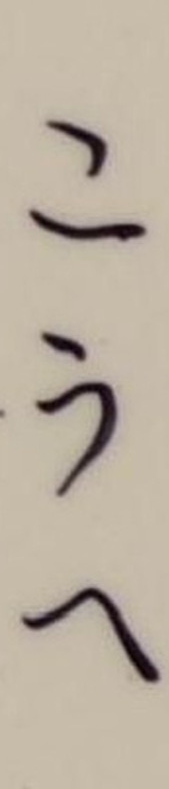こうへ
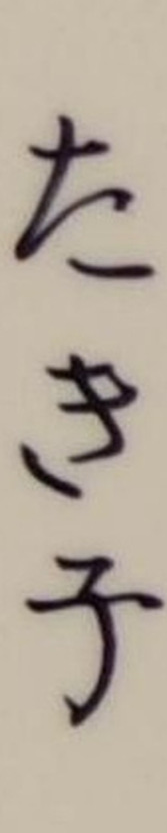たき子
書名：M~S
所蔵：高野山金剛峯寺
